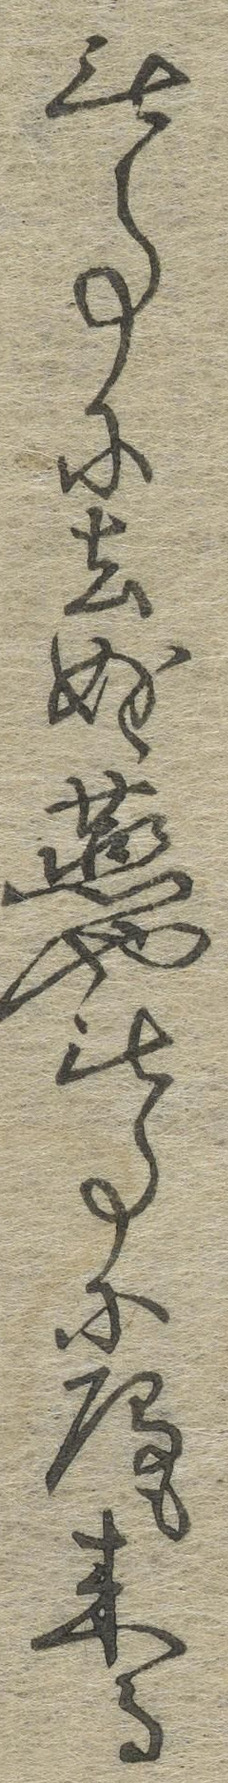無事に去ぬ燕や無事に雁も来る里馨
